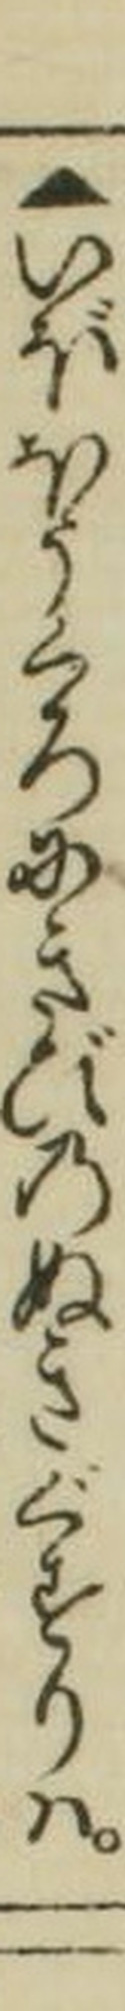▲いぼほうくろにきびのぬきぐすりは。
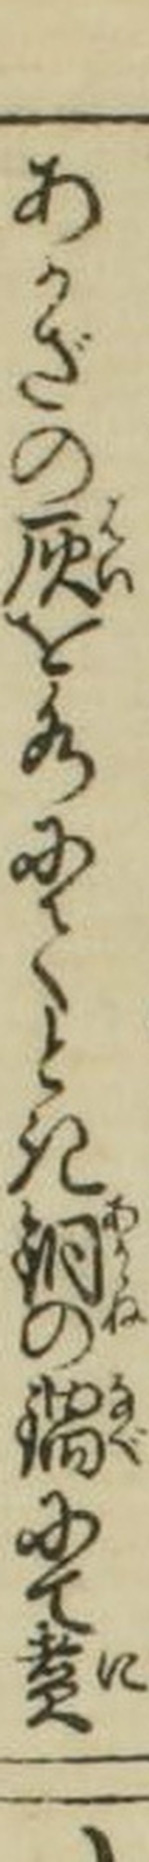あかざの灰を水にてとき銅の鍋にて煮
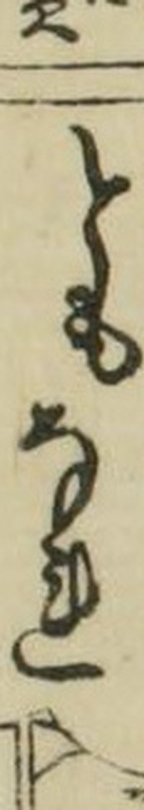ともなれ
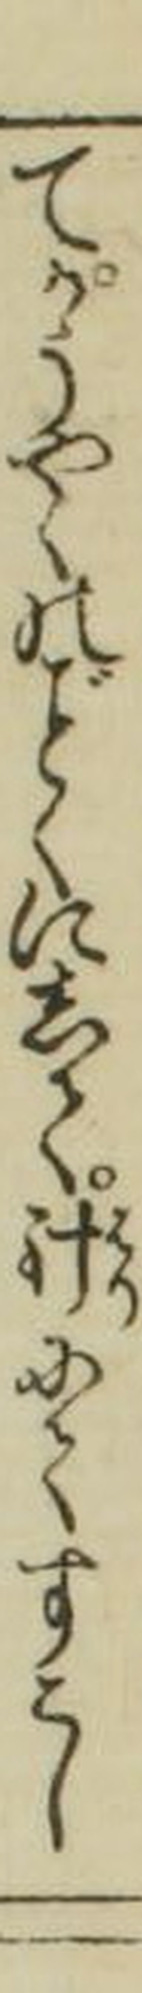て。かうやくのごとくにして。針にてすこし
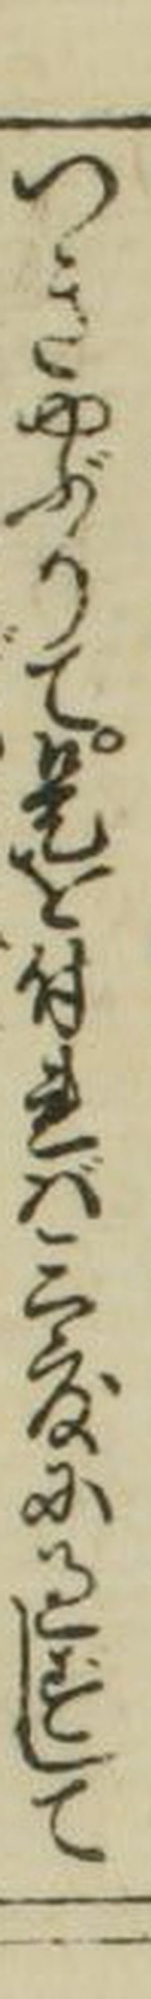つきやぶりて。是を付れば三度にへずして
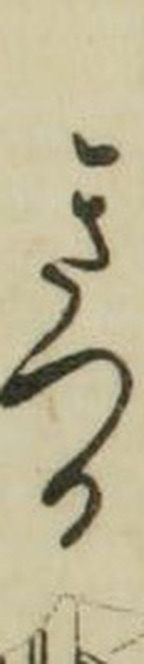きつる
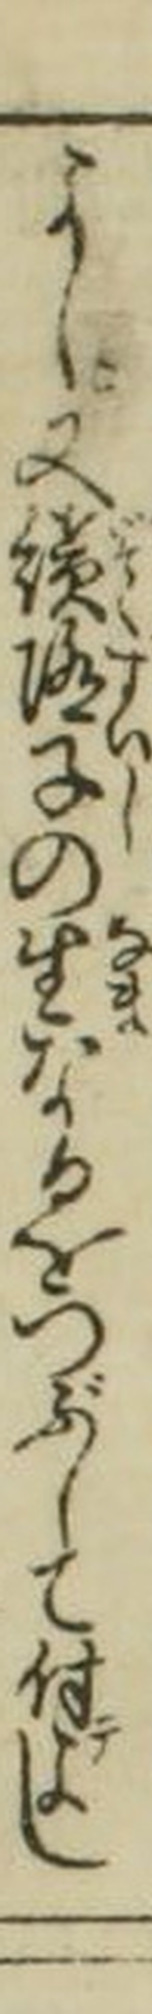よし。又続随子の生なるをつぶして付てよし。
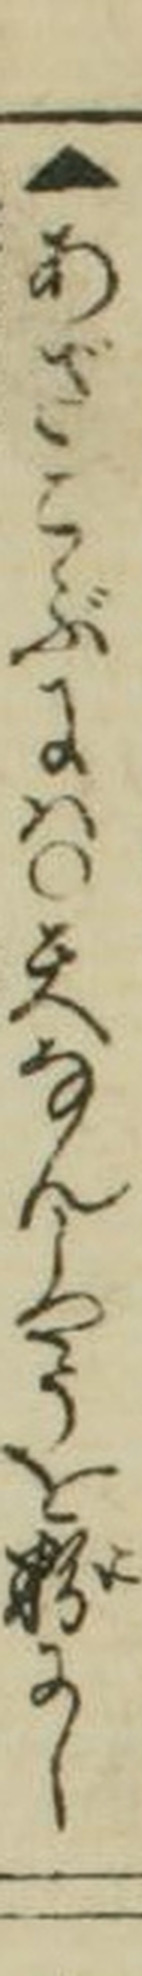▲あざこぶには◯天なんしやうを粉にし
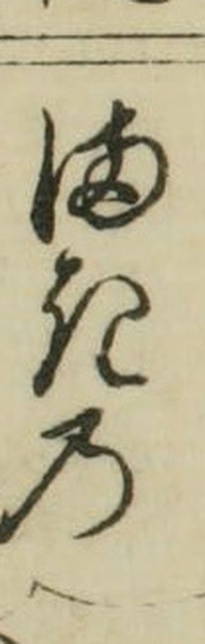まきの
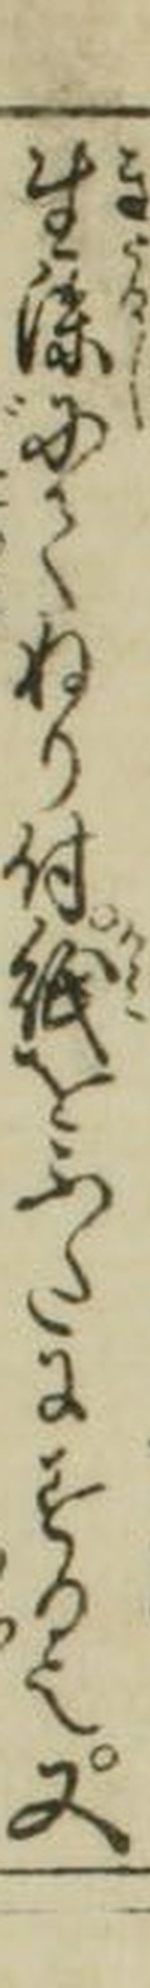生漆にてねり付。紙をふたにする也。又
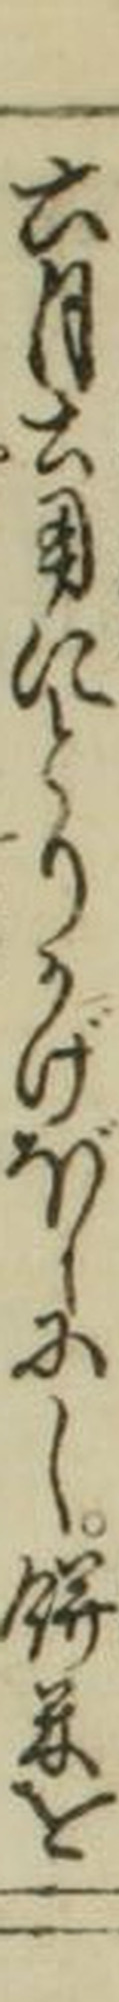六月土用にとりかげぼしにし。餅米を
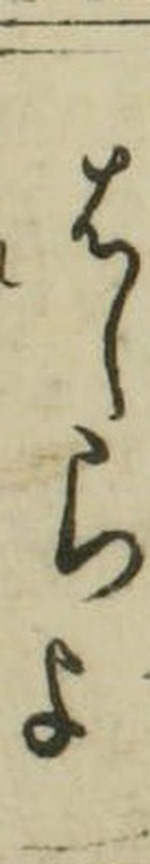はしらよ
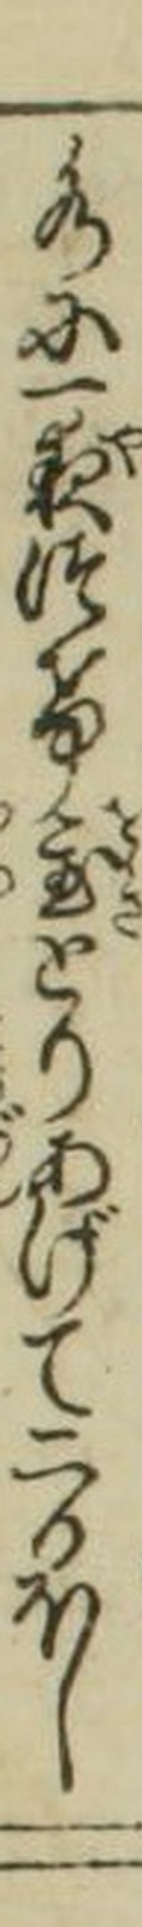水に一夜つけ置とりあげて二日ほし
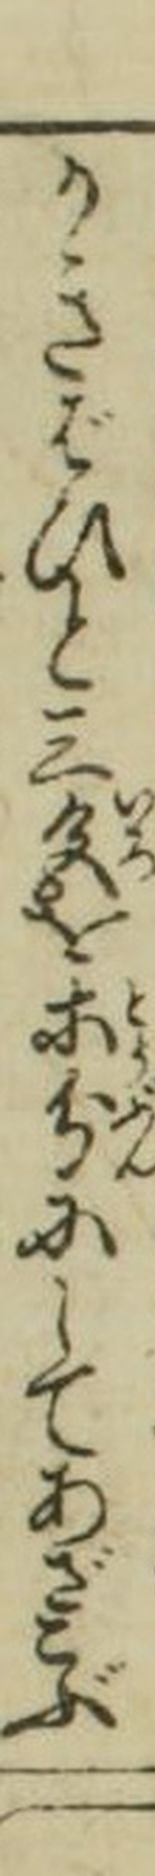かきばひと三色を等分にしてあざこぶ
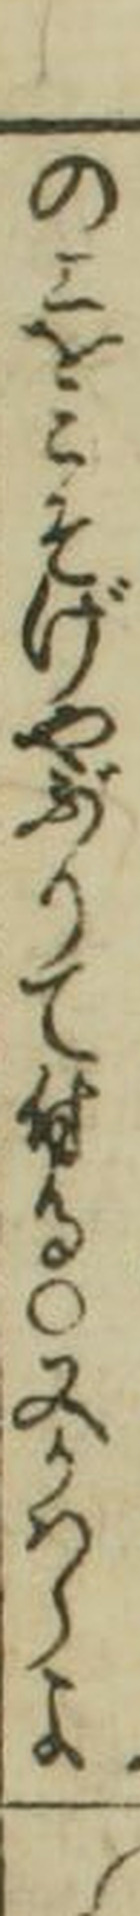の上をこそげやぶりて付る◯又かはらよ

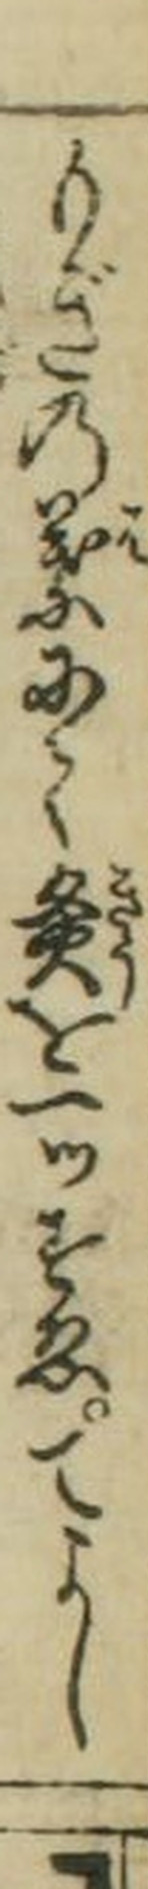もぎの葉にて灸を一ツすゑ。てよし
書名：女源氏教訓鑑
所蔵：東京学芸大学附属図書館
